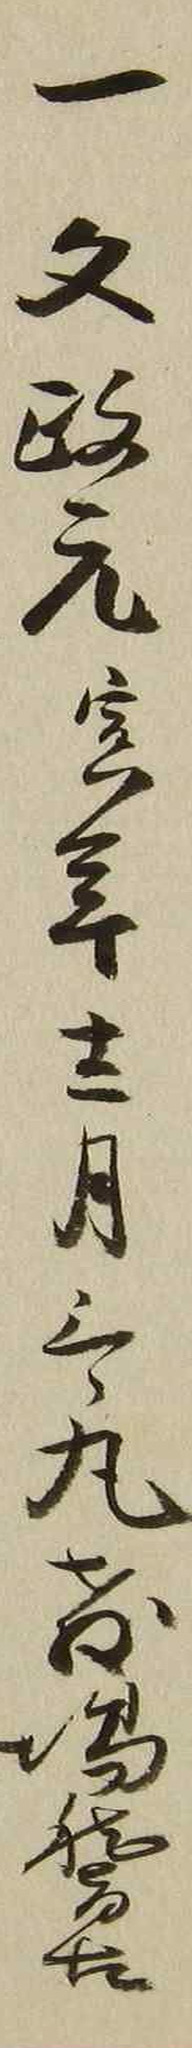一文政元寅年十二月三ノ丸教場稽古
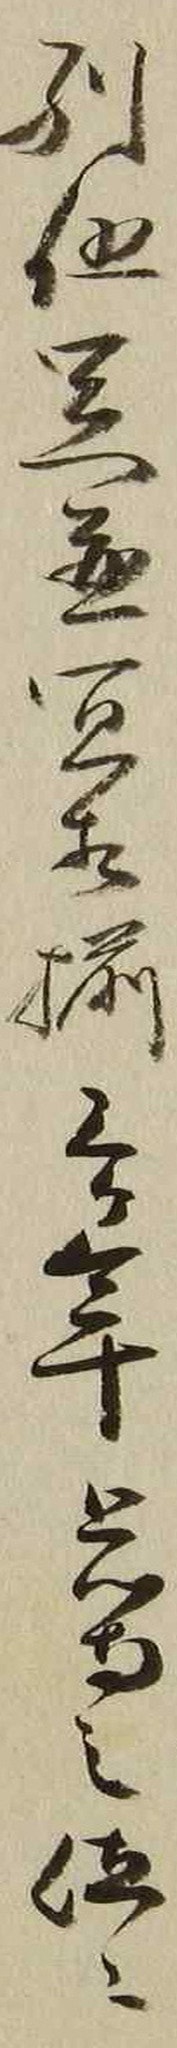列伍足並宜相揃三ヶ年上等之位ニ
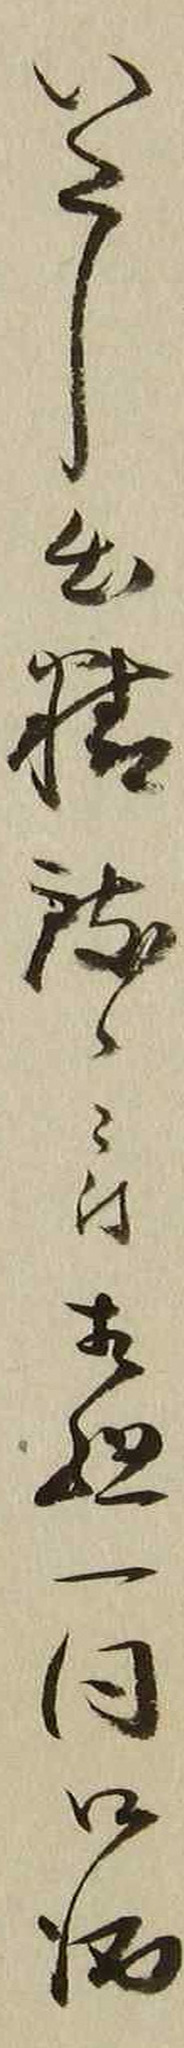いたし出精致候ニ付相組一同御酒
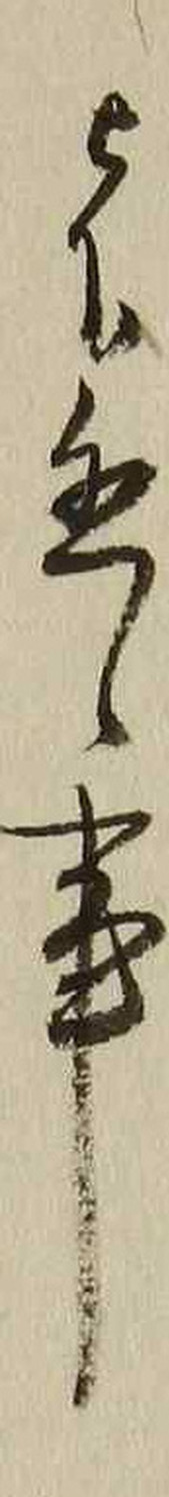被下置候事
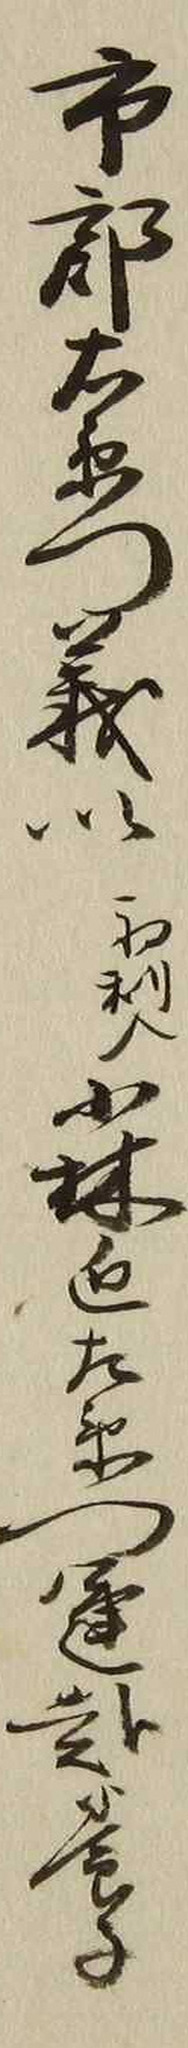市郎右衛門義以初利八小林近左衛門運赴養子
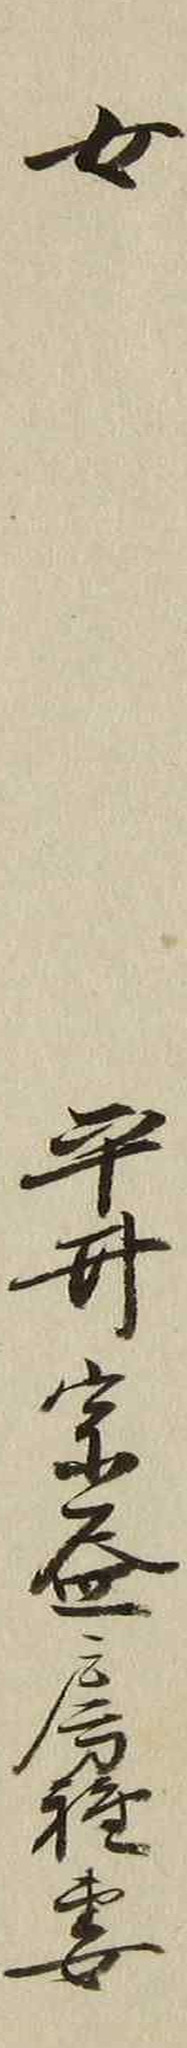女平井宗益房種妻
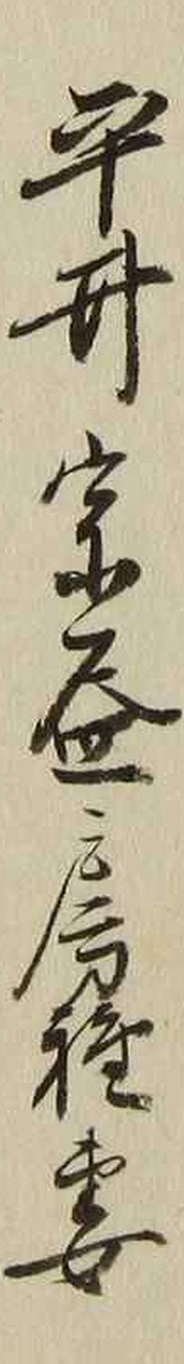女平井宗益房種妻
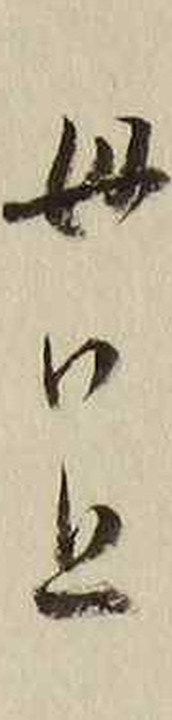母同上

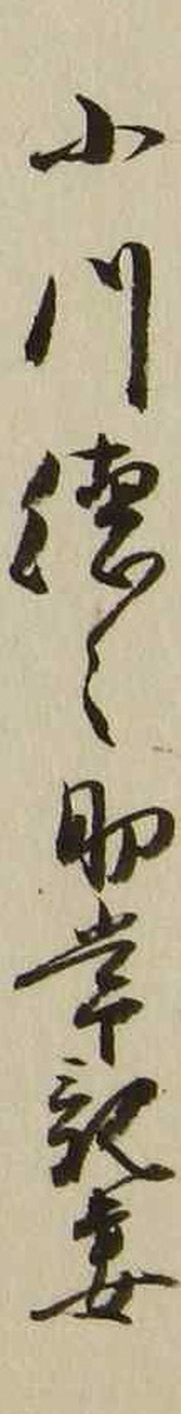小川徳之助常親妻
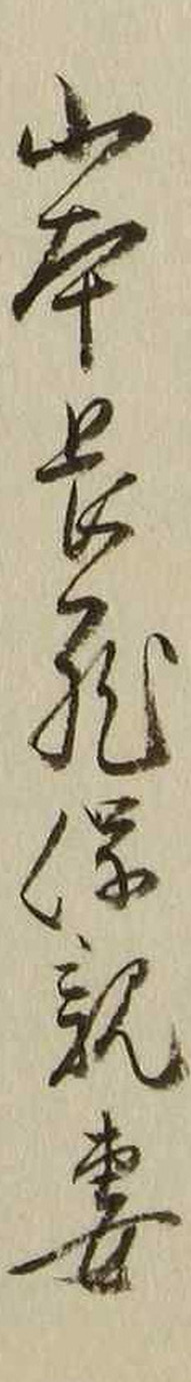山本長蔵保親妻
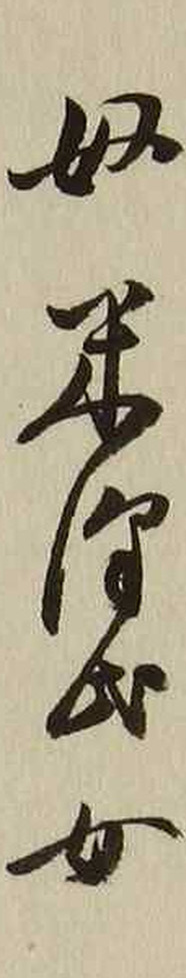母米沢氏女
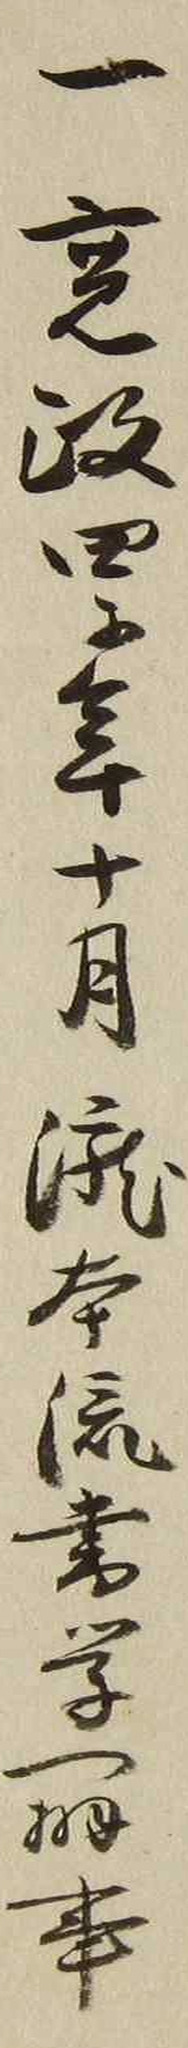一寛政四子年十月滝本流書学弁事
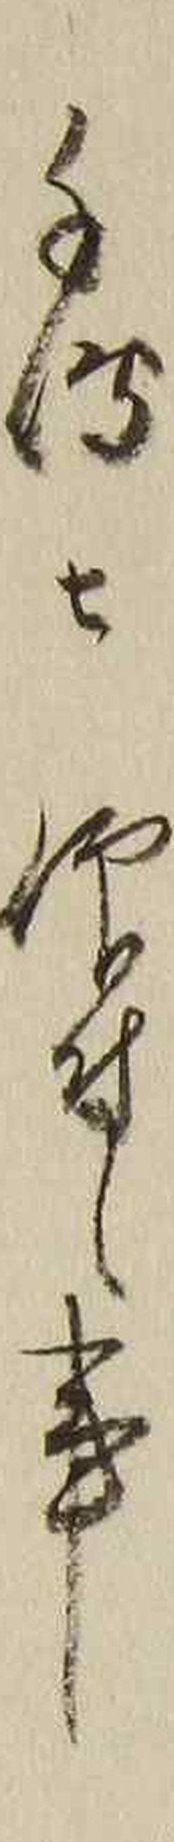手伝被仰付候事
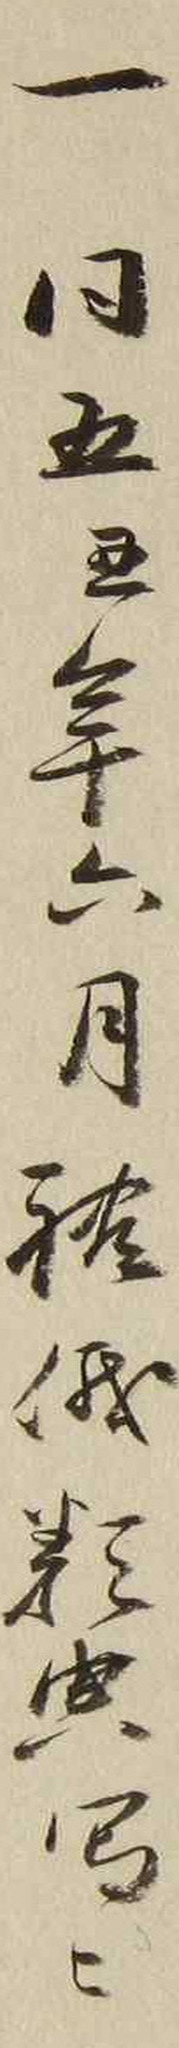一同五丑年六月礼儀類典写被
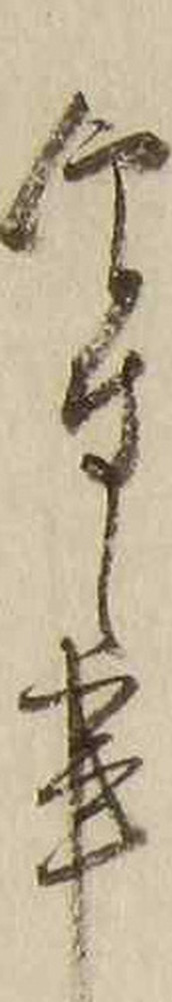仰付候事

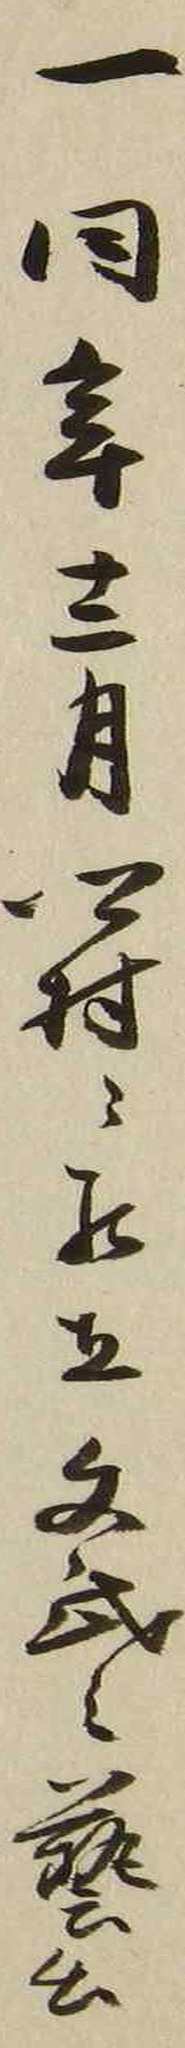一同年十二月郷村ニ罷在文武之芸出
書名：諸士系譜　巻之288　さ之部20
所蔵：会津若松市立会津図書館
